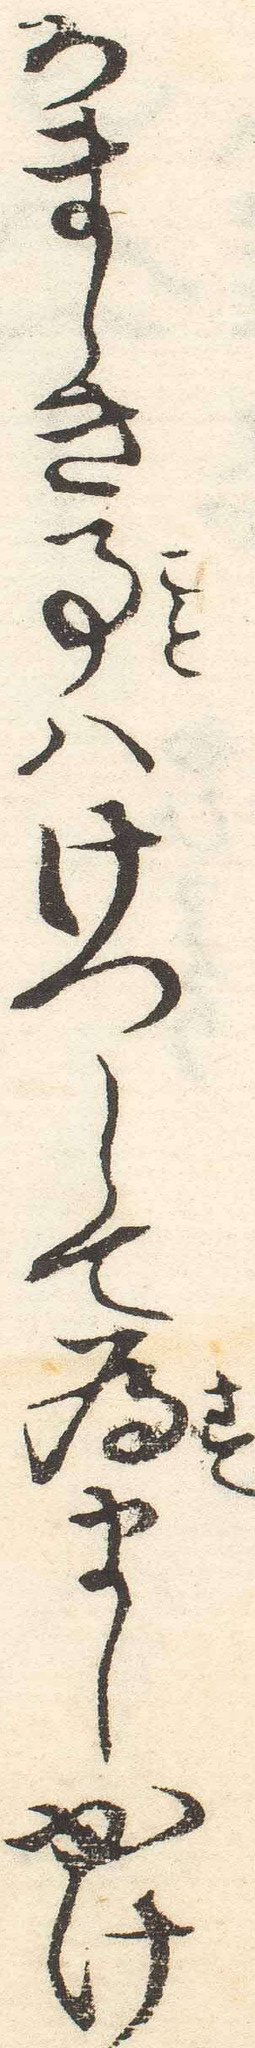かましき事はけつして為ましかけ
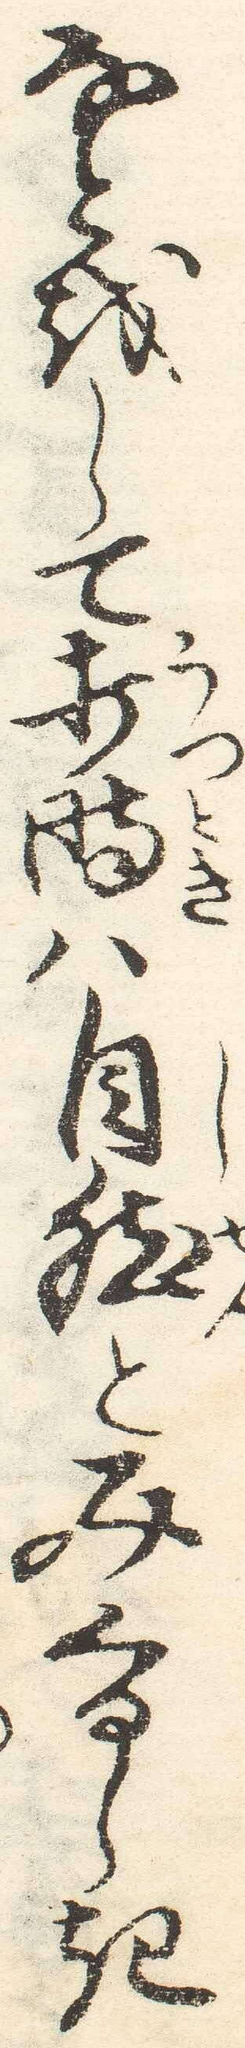なとをして打時は自然とみくるしき
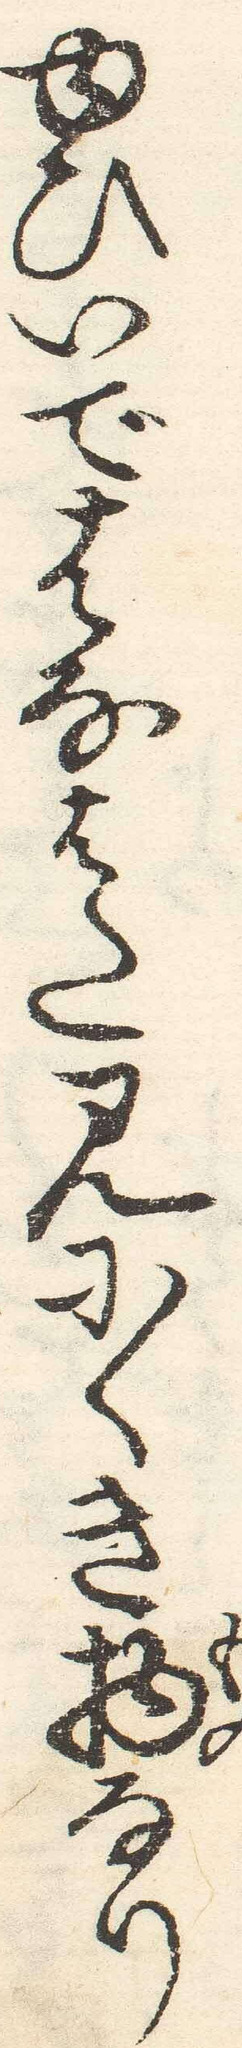ゆひいではなはた見にくき物なり
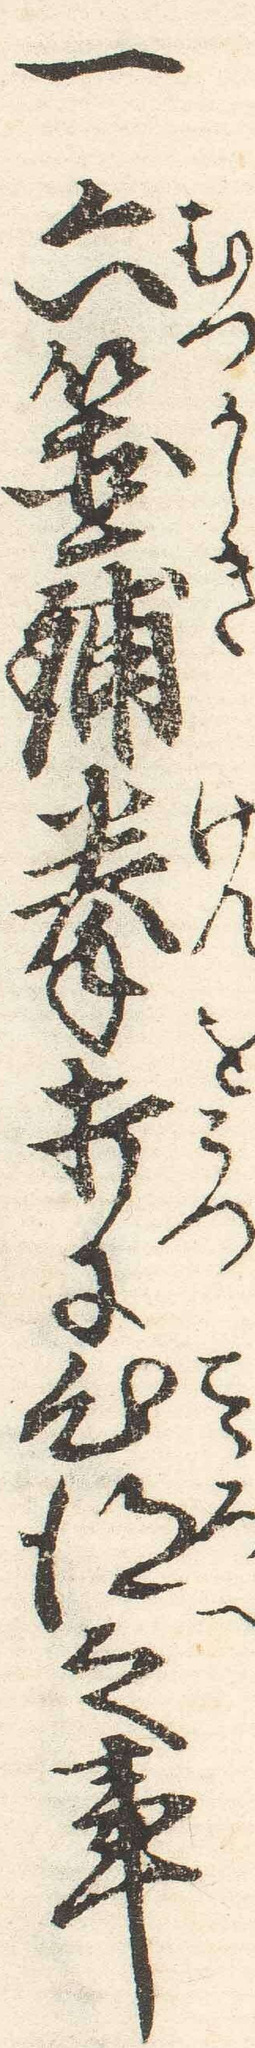一六箇鋪拳打に心得之事
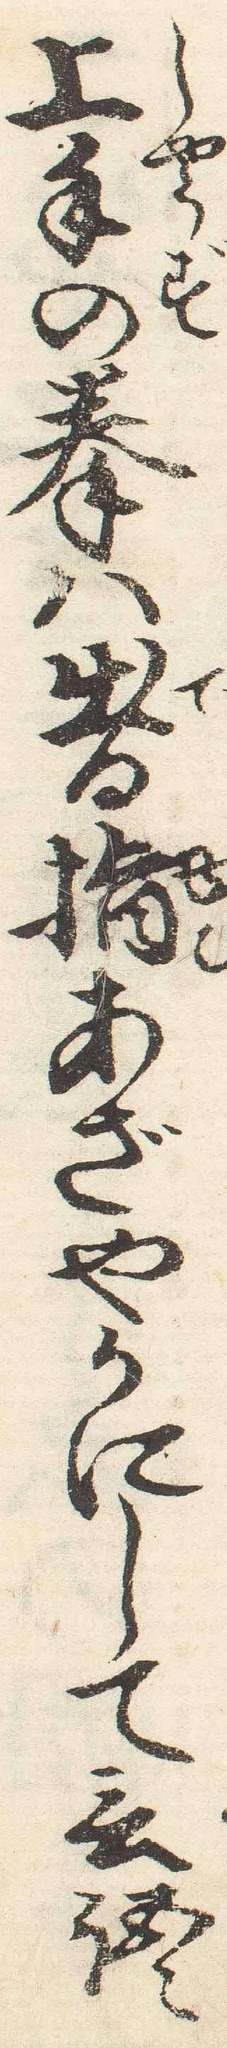上手の拳は出る指あざやかにして言語

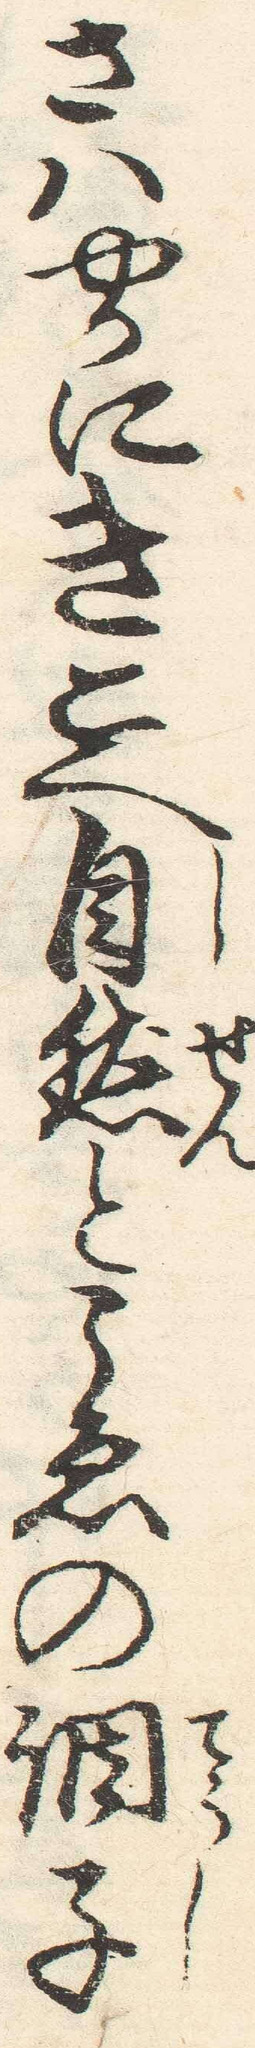さはやかにきこへ自然とこゑの調子
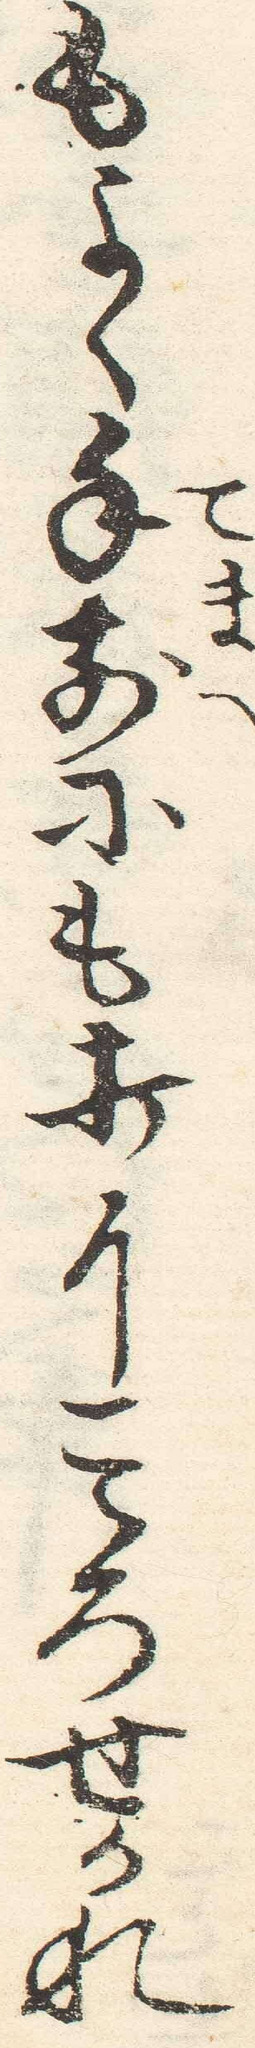もよく手前にも打にこゝろせかれ
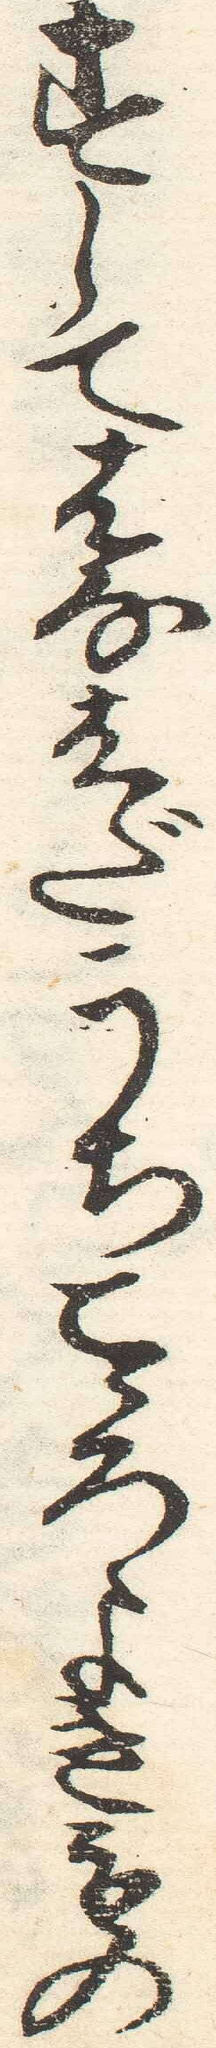すしてはなはだうちこゝろよきもの
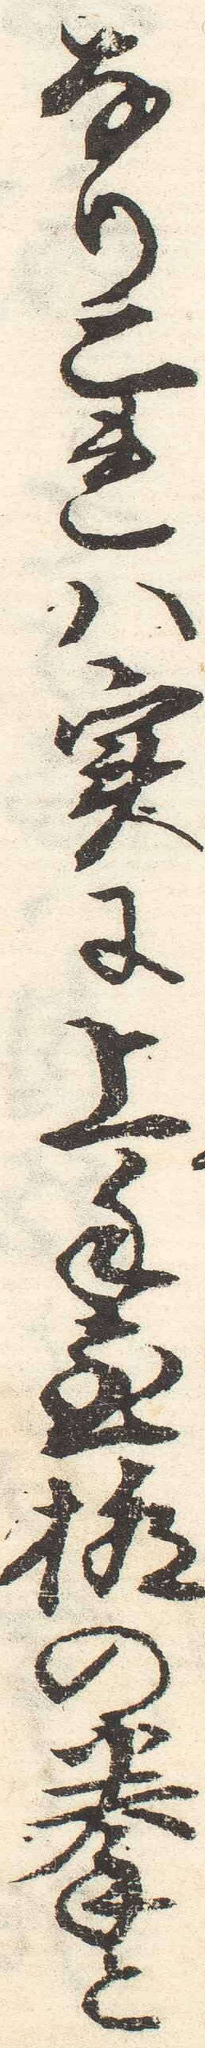なりこれは実に上手至極の拳と
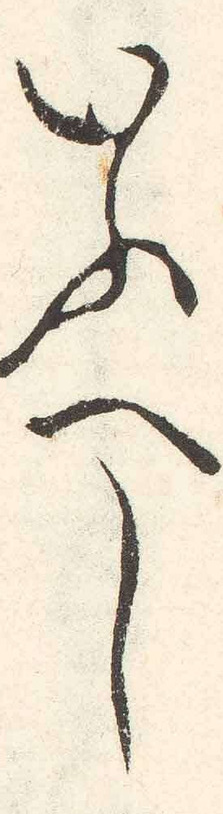いふへし
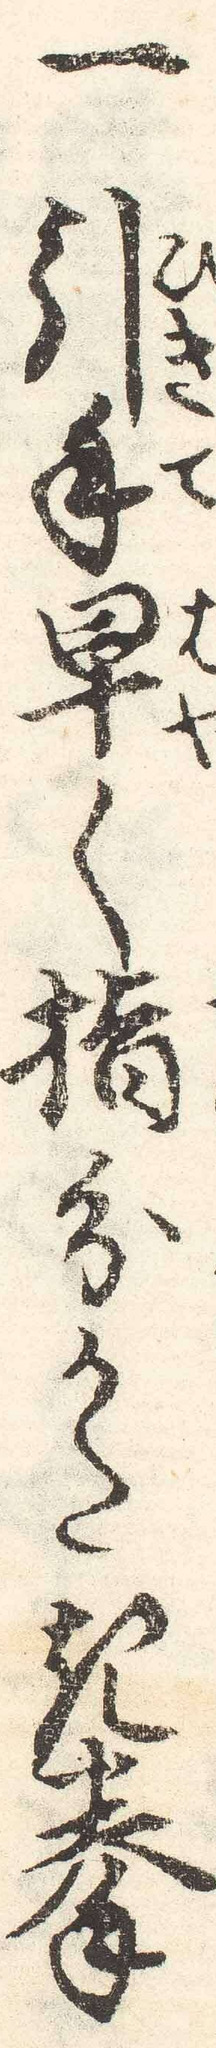一引手早く指分かたき拳
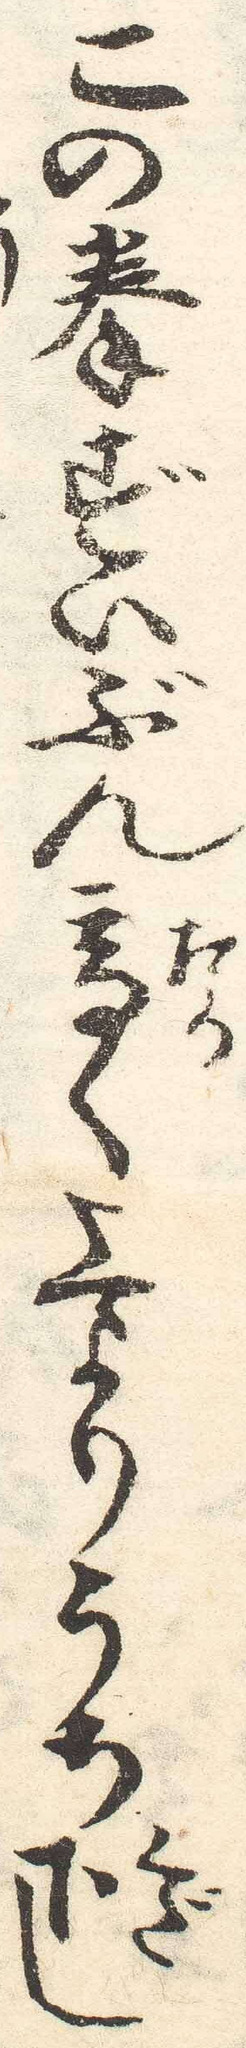この拳ずいぶん高く上よりうち下し
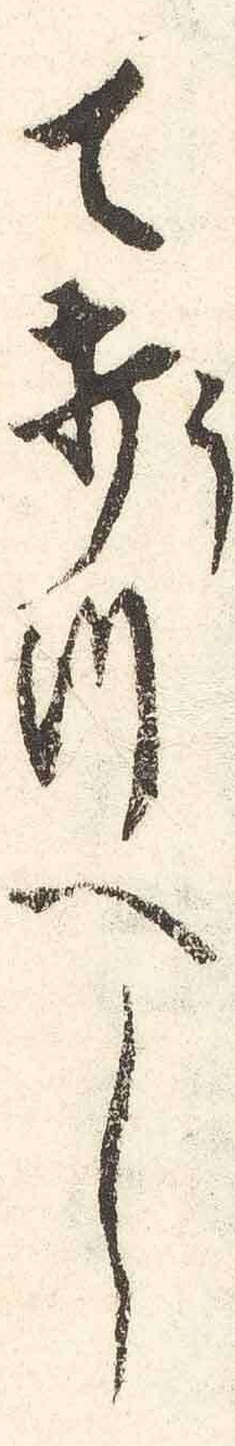て打つへし
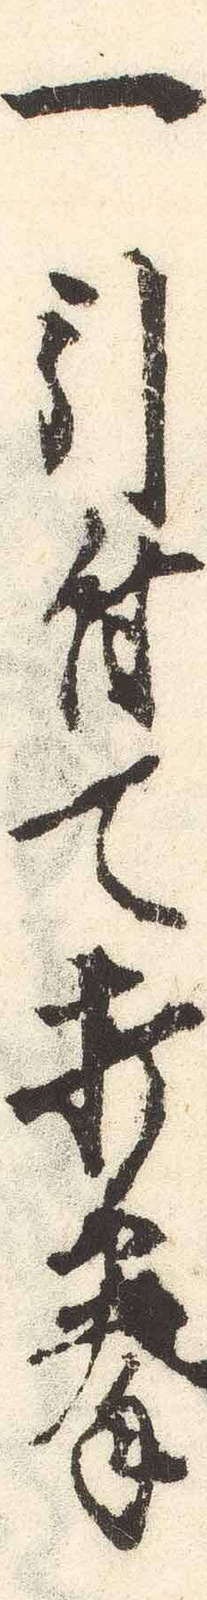一引付て打拳
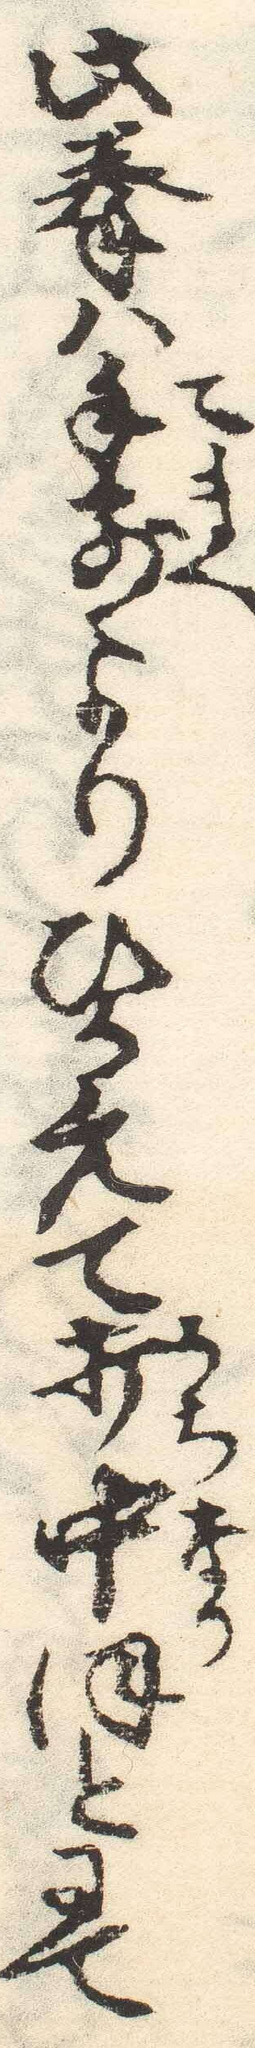此拳は手前よりひかえて打中ほとにて
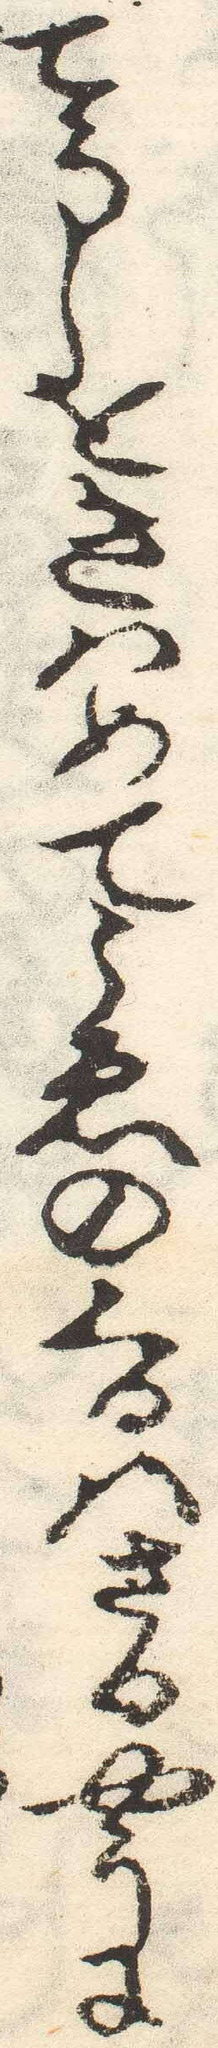てうしをきはめてこゑのくるはさるやうに
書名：拳独稽古
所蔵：東京学芸大学附属図書館 国文学研究資料館
